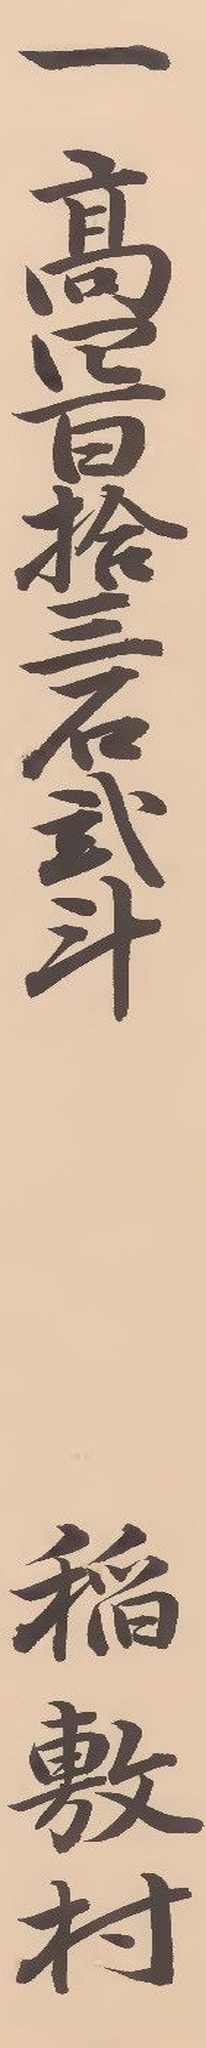一高四百拾三石弐斗稲敷村
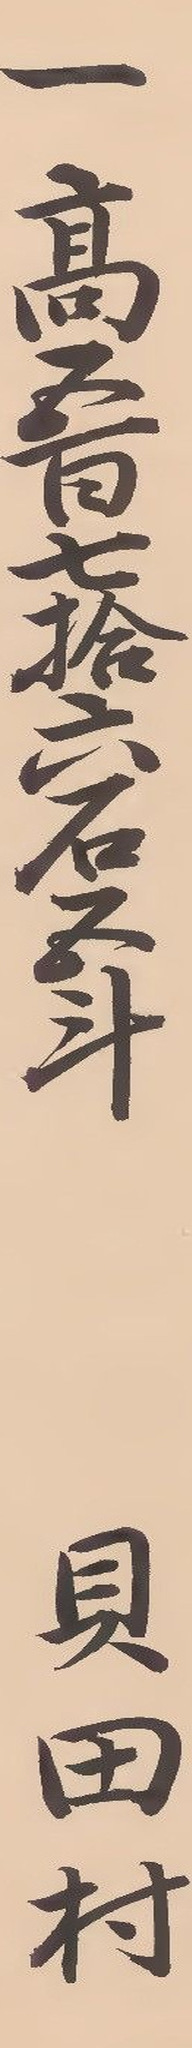一高五百七拾六石五斗貝田村
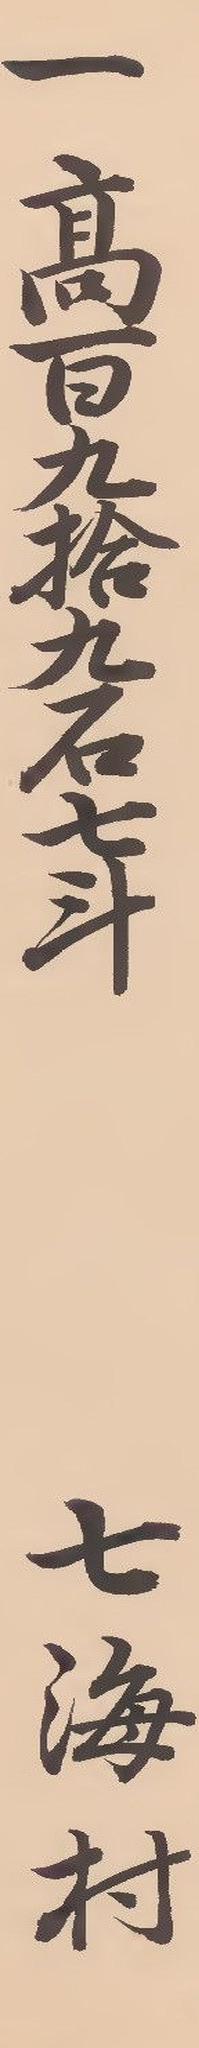一高百九拾九石七斗七海村
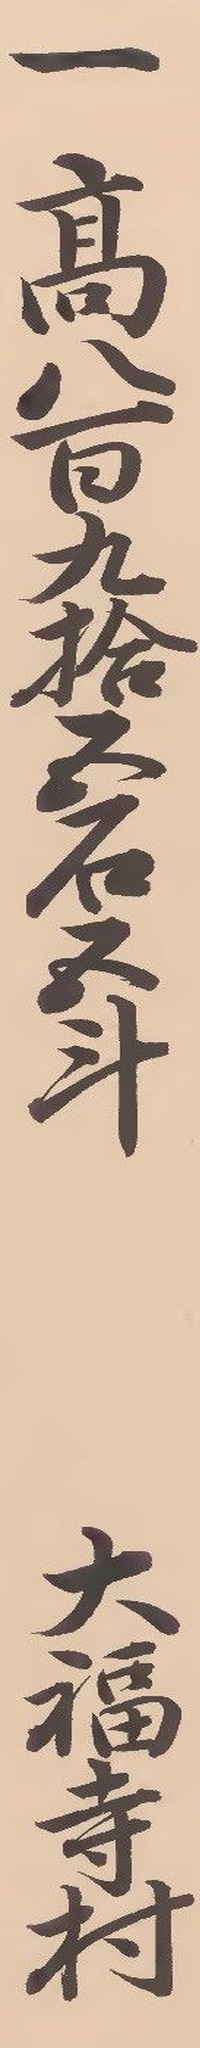一高八百九拾五石五斗大福寺村

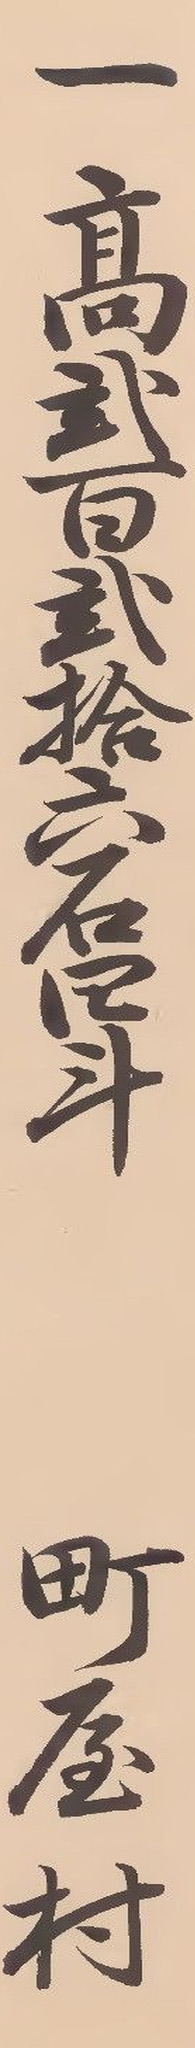一高弐百弐拾六石四斗町屋村
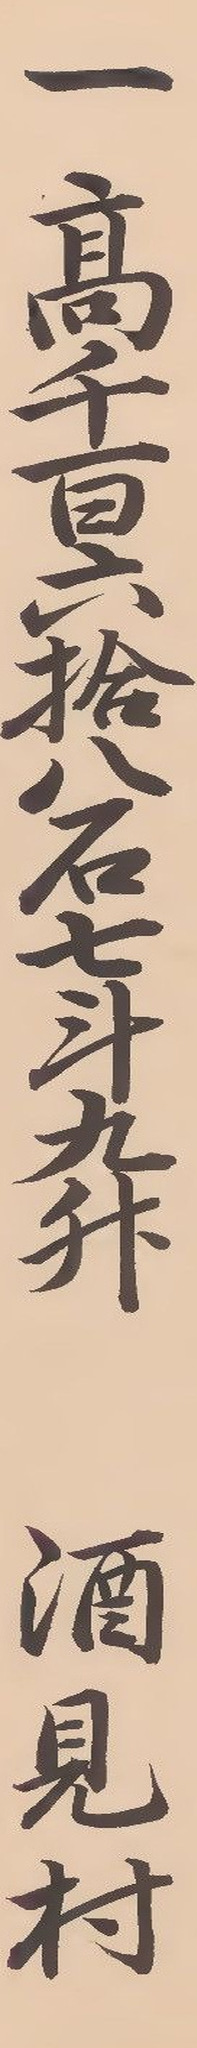一高千百六拾八石七斗九升酒見村

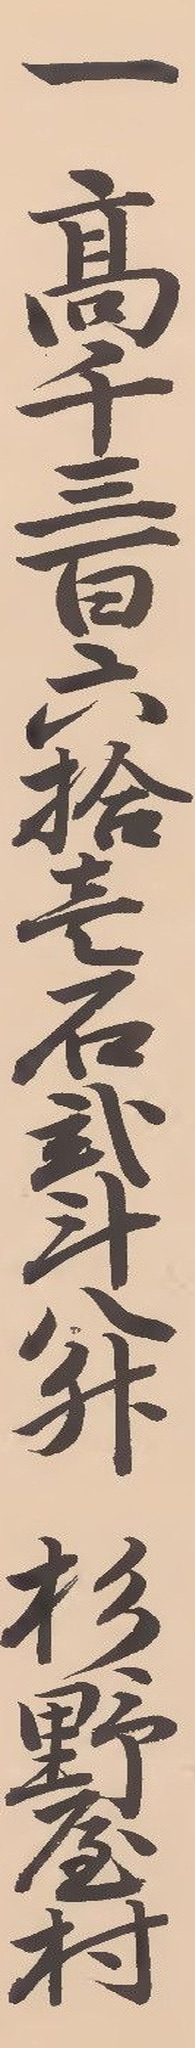一高千三百六拾壱石弐斗八升杉野屋村
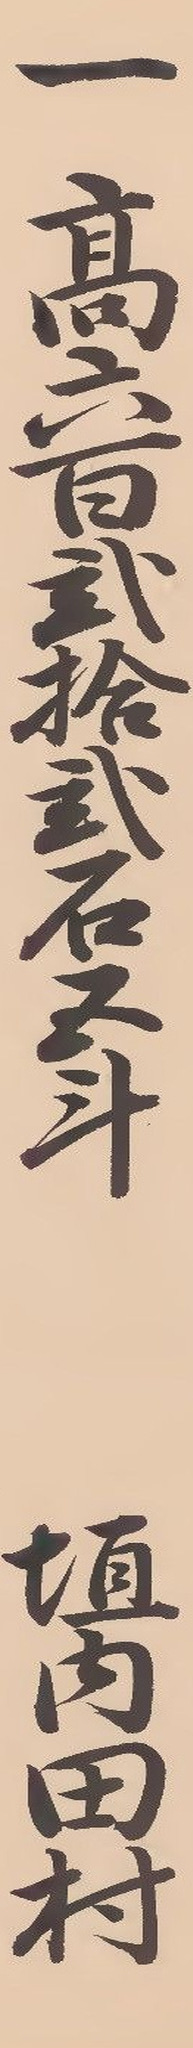一高六百弐拾弐石五斗垣内田村
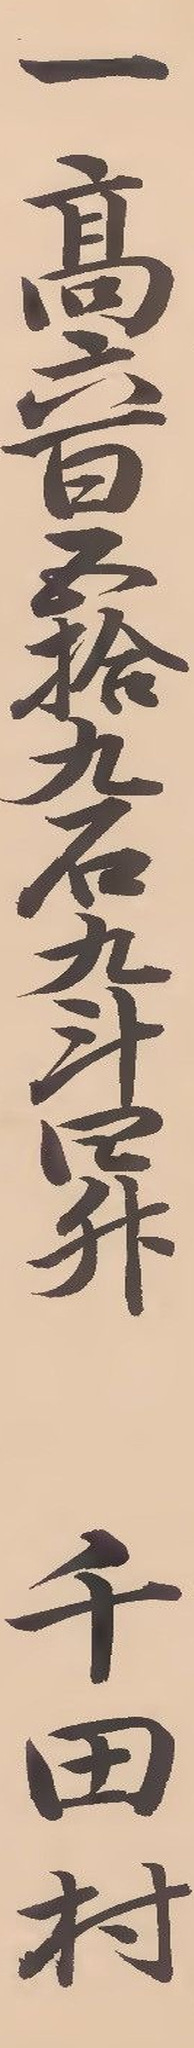一高六百五拾九石九斗四升千田村
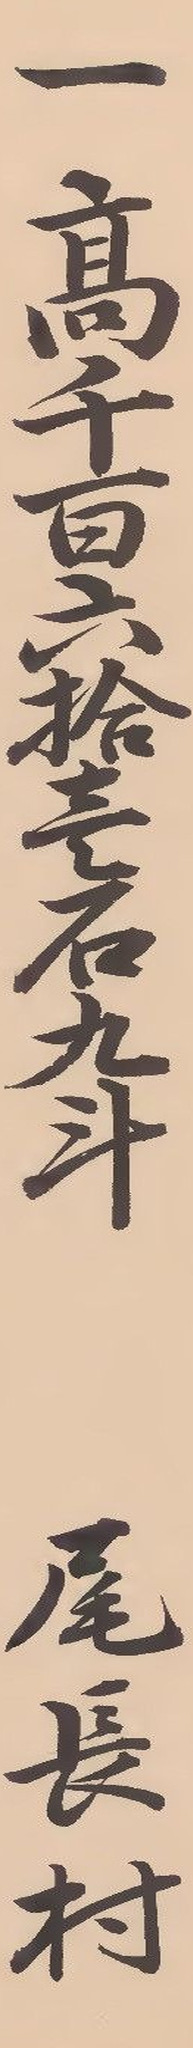一高千百六拾壱石九斗尾長村
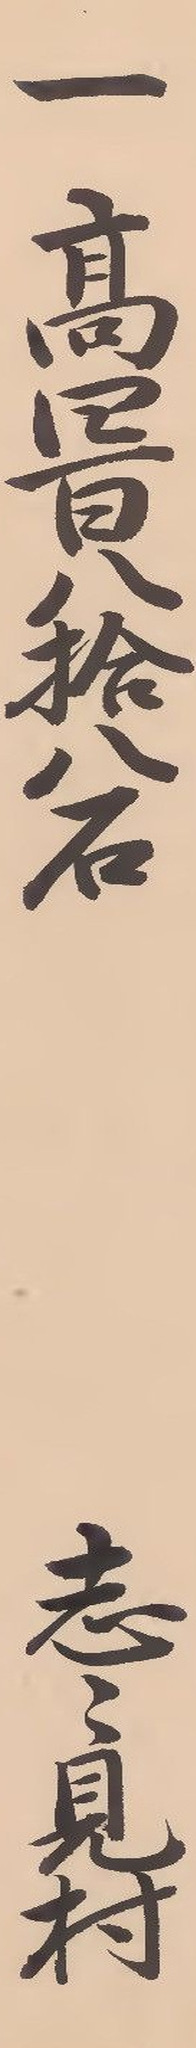一高四百八拾八石志々見村
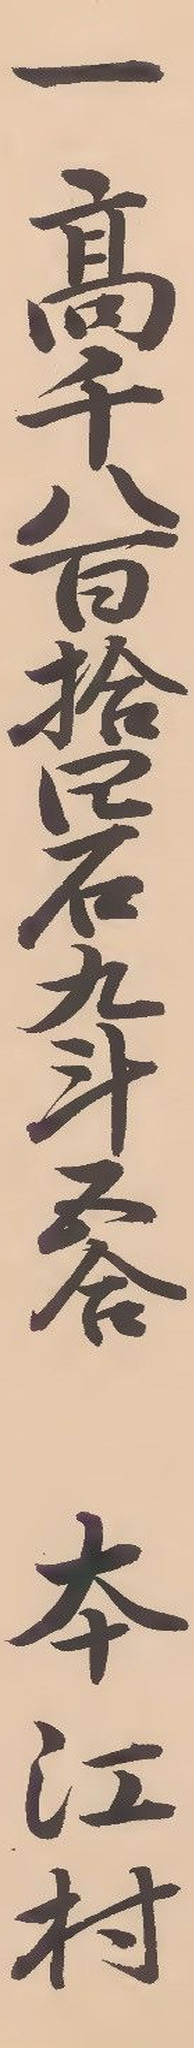一高千八百拾四石九斗五合本江村

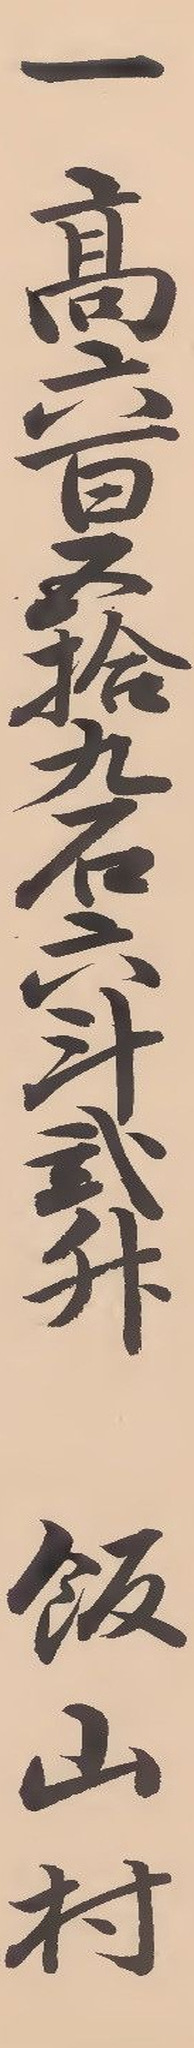一高六百五拾九石六斗弐升飯山村
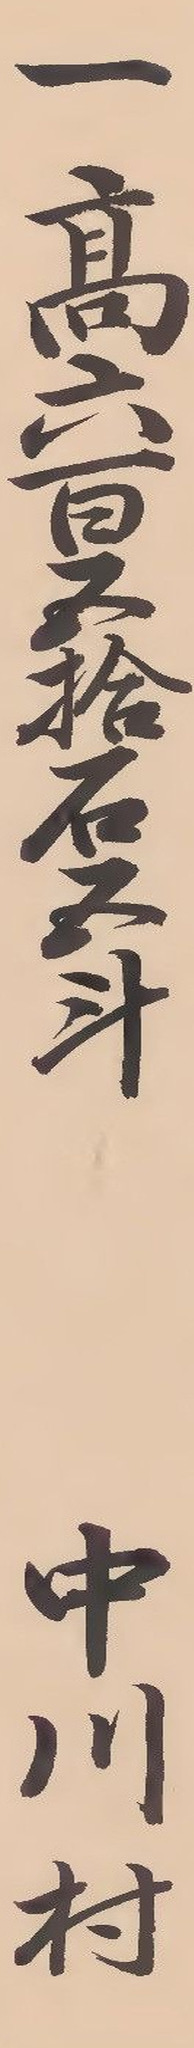一高六百五拾石五斗中川村
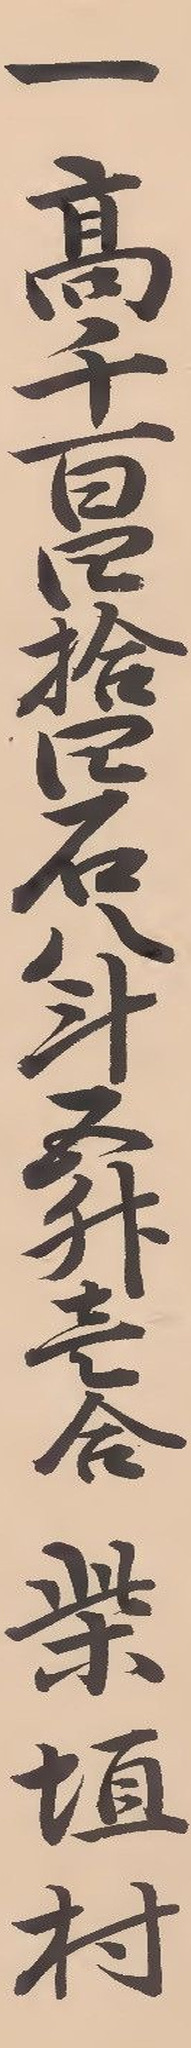一高千百四拾四石八斗五升壱合柴垣村
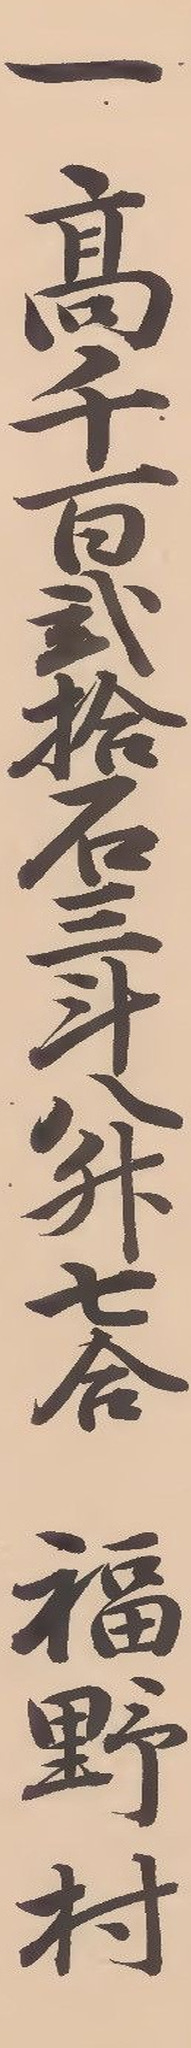一高千百弐拾石三斗八升七合福野村
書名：能登国郷帳
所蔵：国立公文書館 National Archives of Japan
